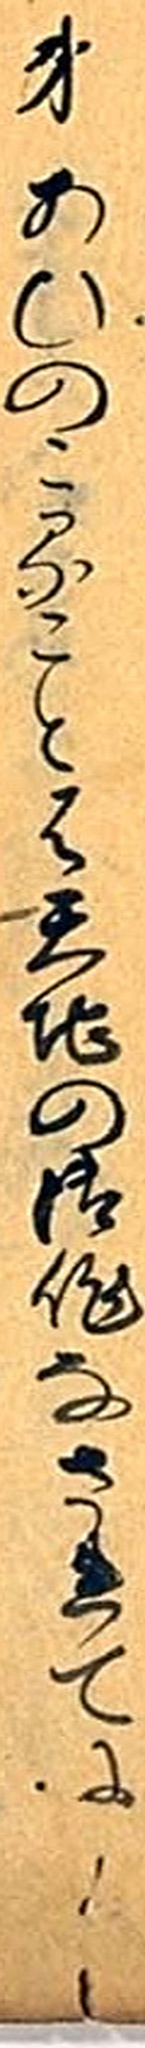弟あひのこることは天地の御作なされてに
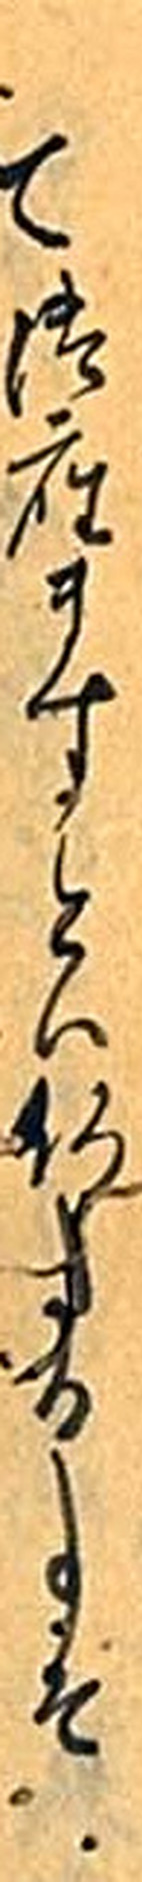て御座ますとは何たる事そ
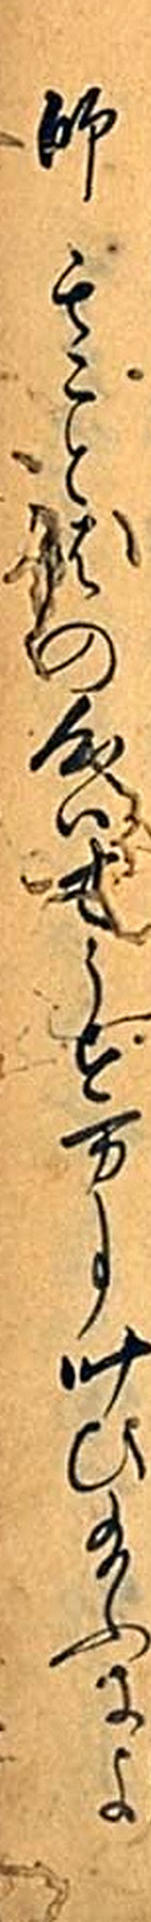師其ことはの心はてうす万事叶ひ給ふによ

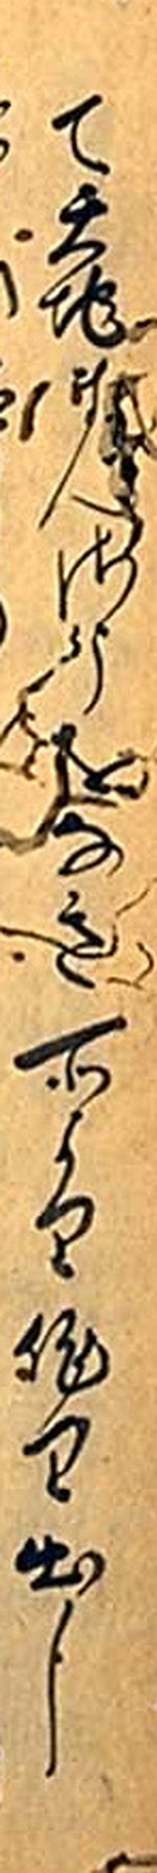て天地まんさうをなき所より作り出し
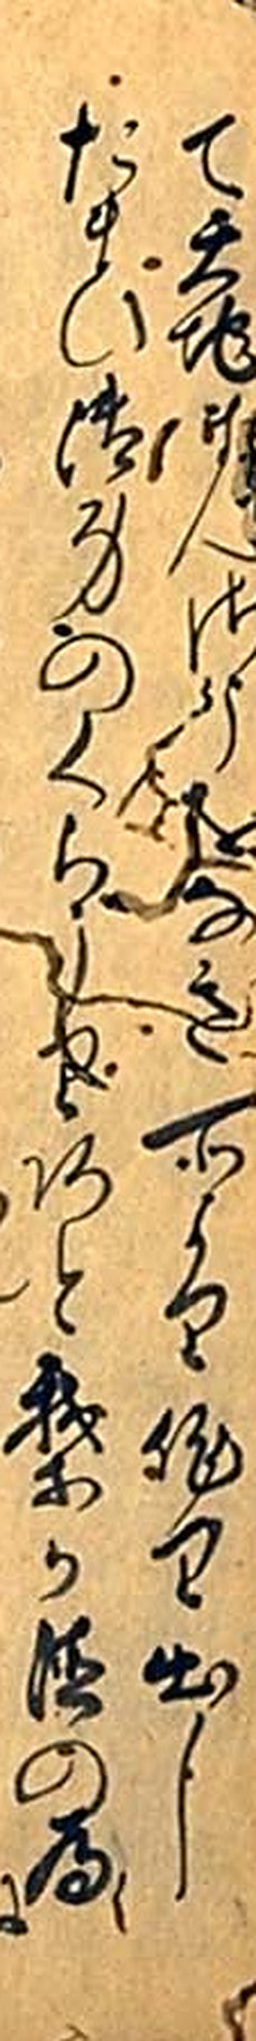たまひ御身のくらうりあと我等か徳の為に
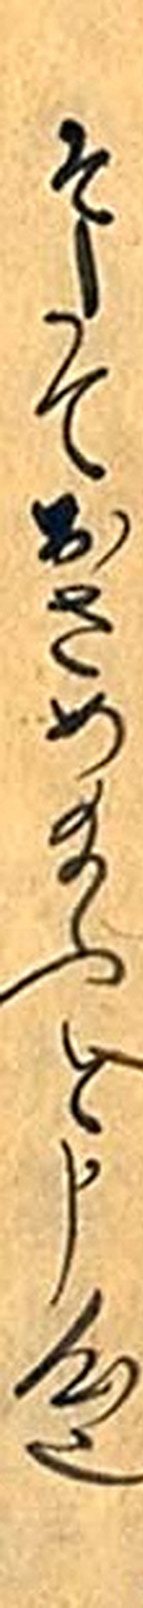そたておさめ給ふと申心也
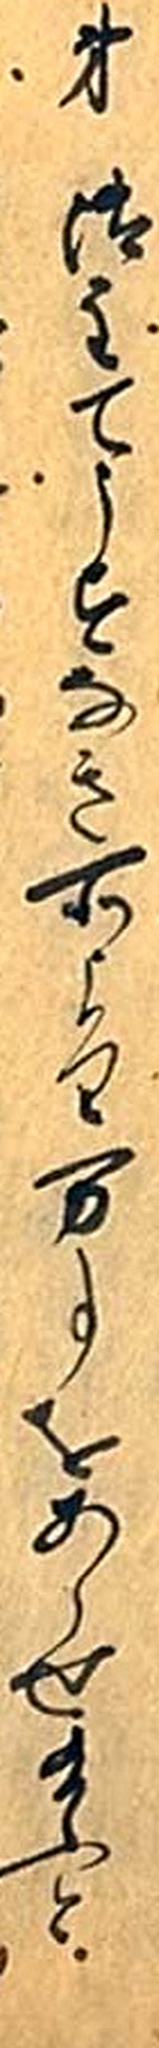弟御主てうすなき所より万事をあらせ給ふと
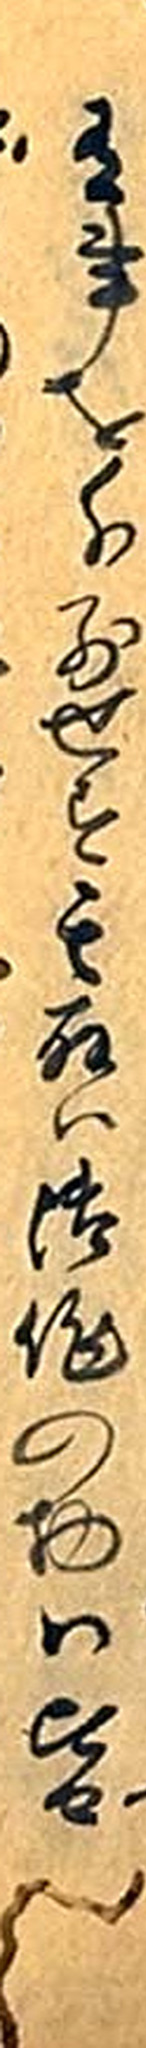有事を分別せす其故は御作の物は皆
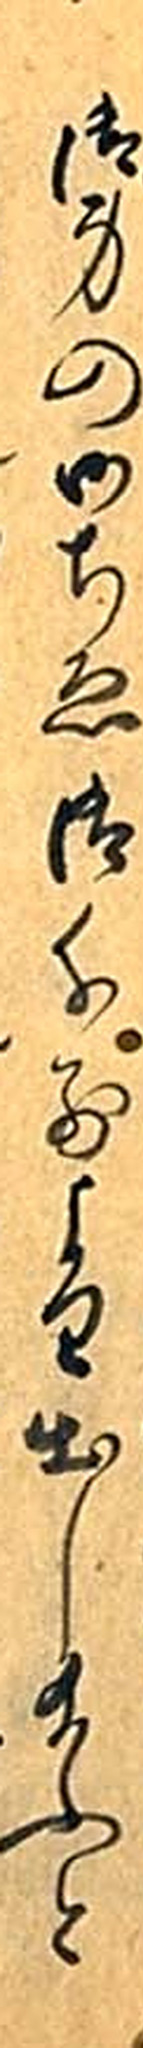御身の御ちゑ御分別より出し給ふと
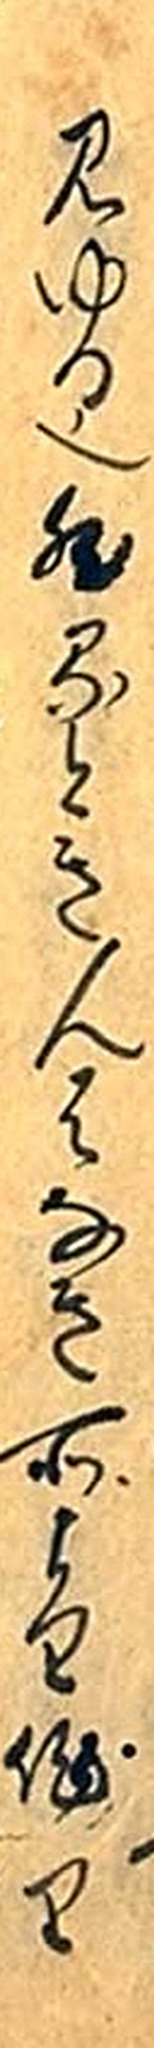見ゆる也然るときんはなき所より作り
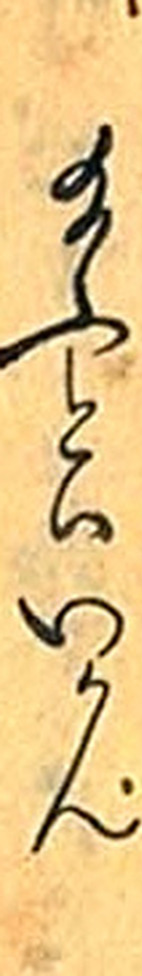給ふとはいかん
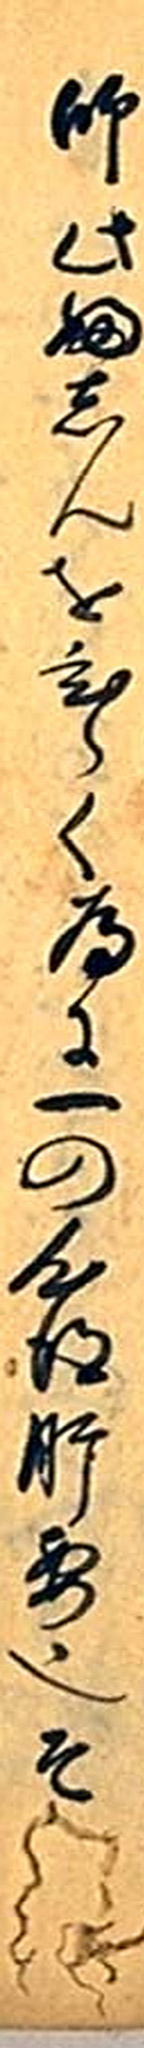師此ふしんをひらく為に一の心得肝要也そ
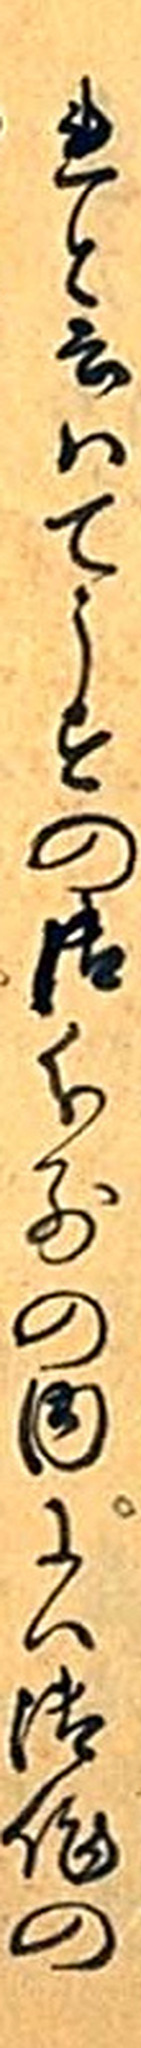れと云はてうすの御分別の内には御作の
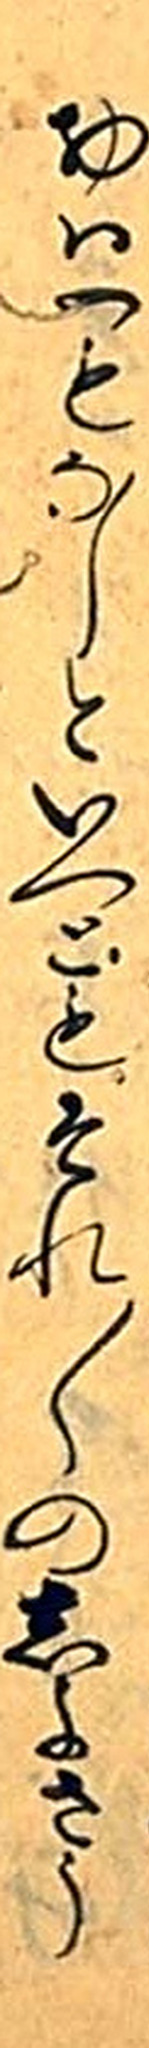物は一もなしといへともそれ〳〵のしよさう
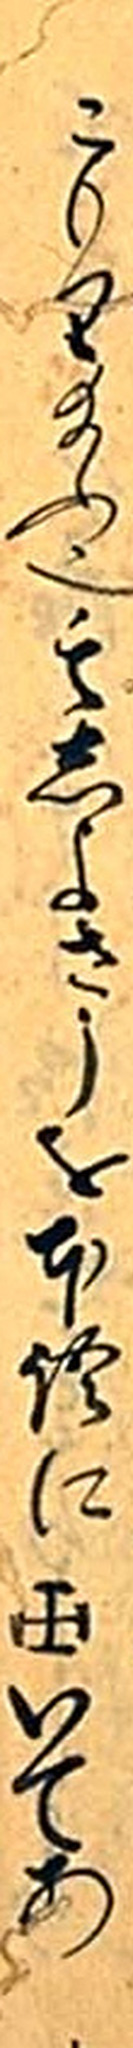こもり給ふ也其しよさうを本語に☩いてあ
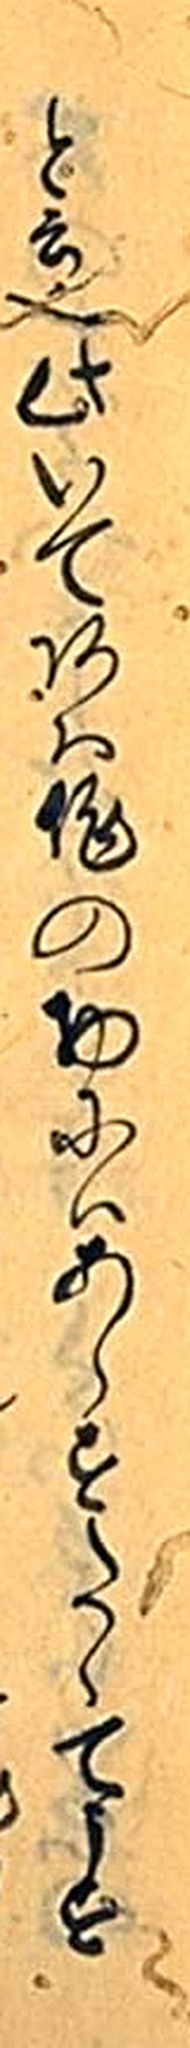と云也此いてあは作の物にはあらすたゝてうす
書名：ドチリナ・キリシタン
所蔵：東京大学総合図書館 / General Library in the University of Tokyo
